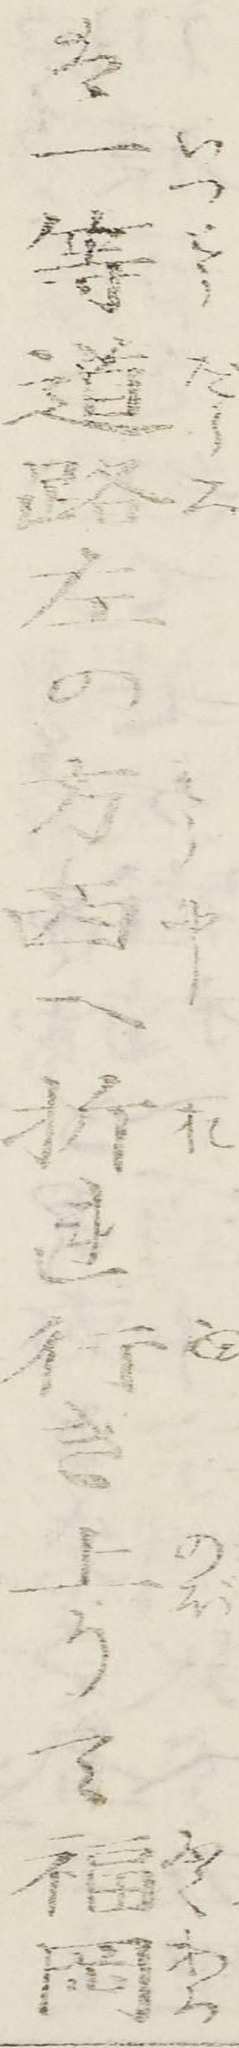右は一等道路左の方西へ折れ行き上りて福岡

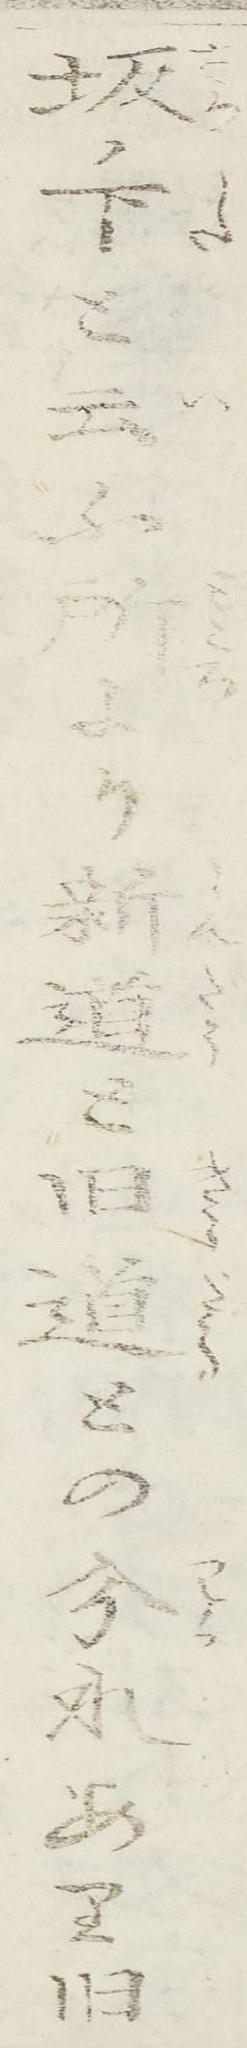坂ノ下と云ふ所より新道と旧道との分れあり旧
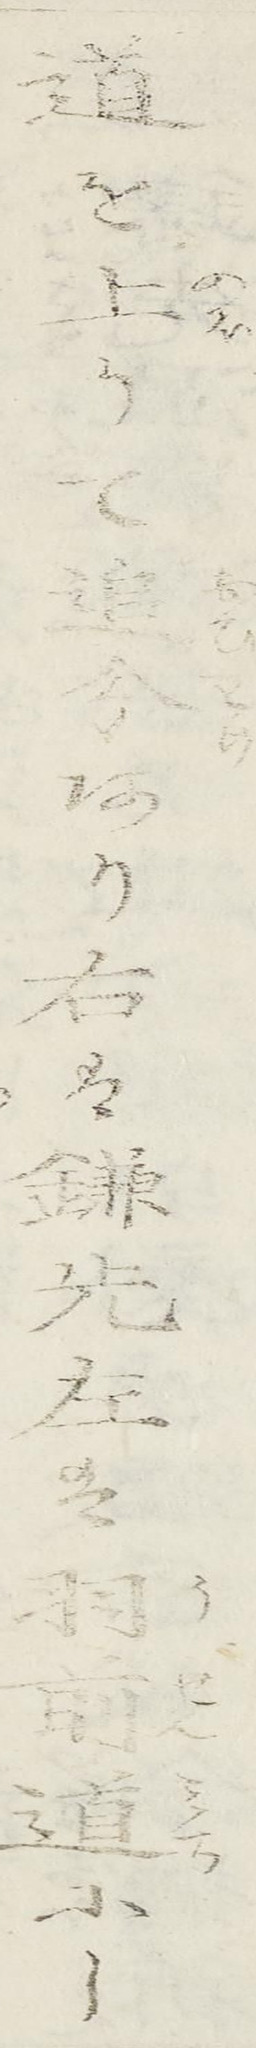道を上りて追分あり右は鎌先左は羽前道にし
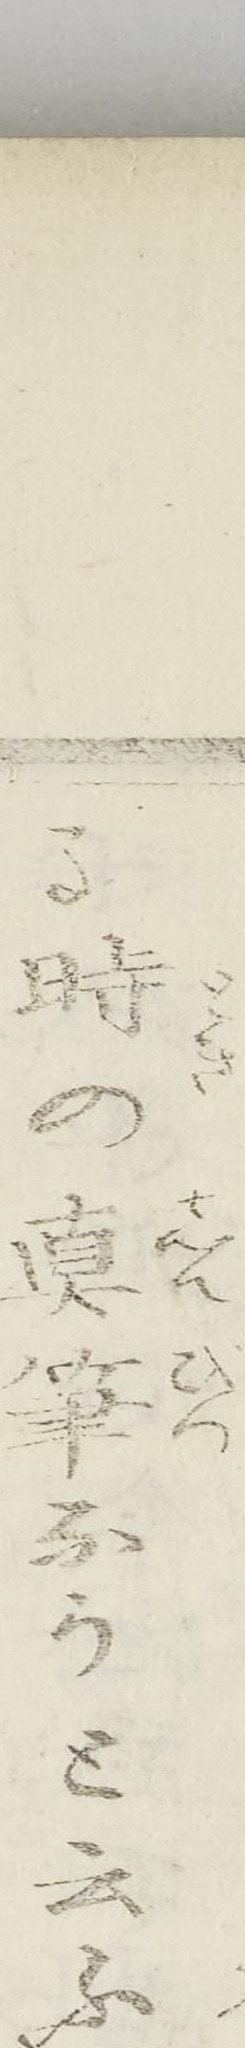る時の真筆なりと云ふ
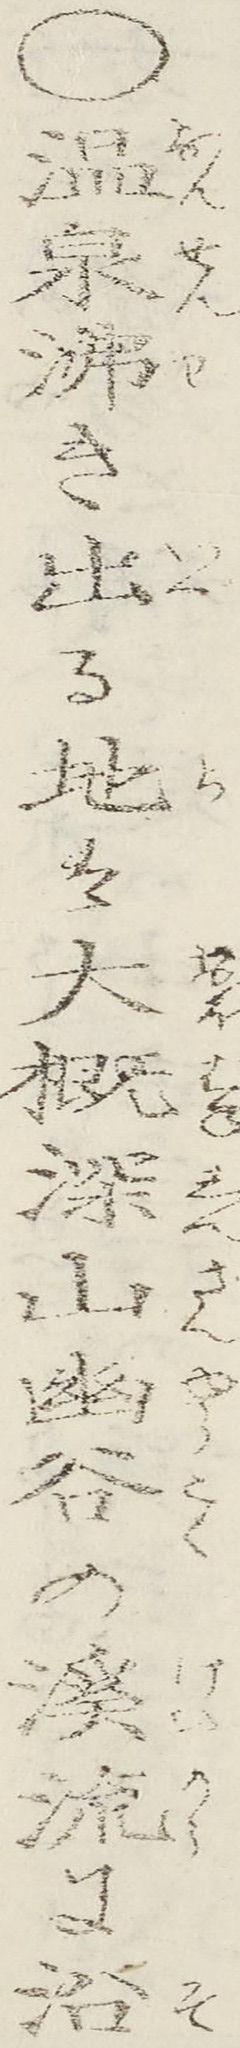〇温泉沸き出る地は大概深山幽谷の溪流に沿
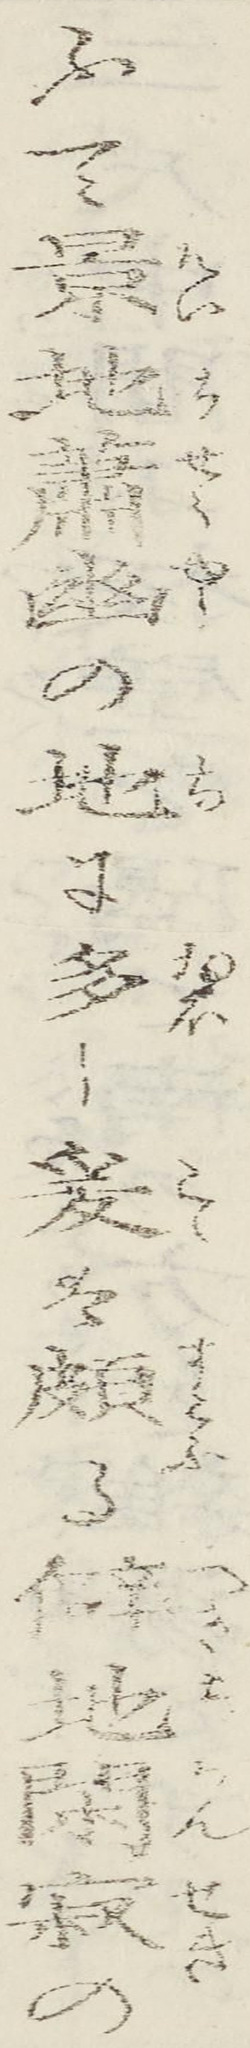ふて景地蕭幽の地に多し爰は頗る僻地閑寂の
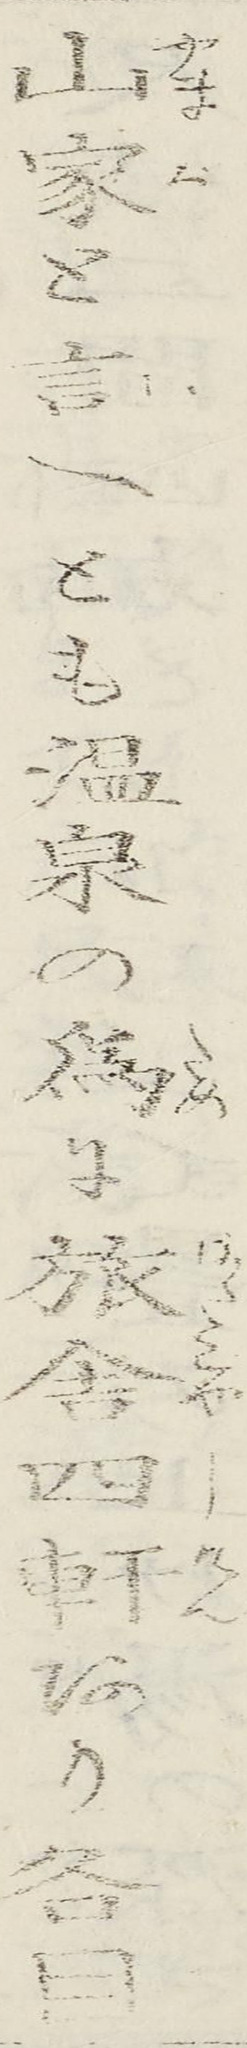山家と言へとも温泉の為に旅舎四軒あり各目
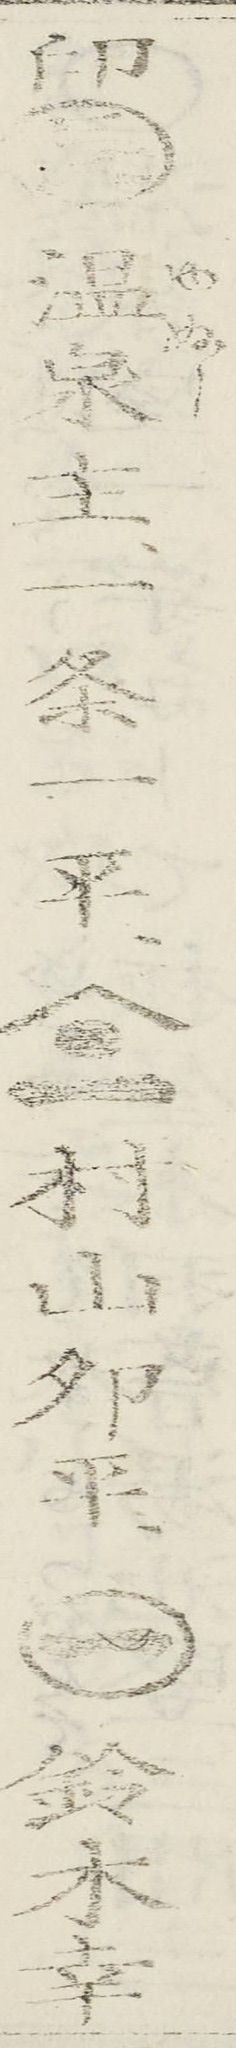印温泉主、一条一平、村山卯平、鈴木幸
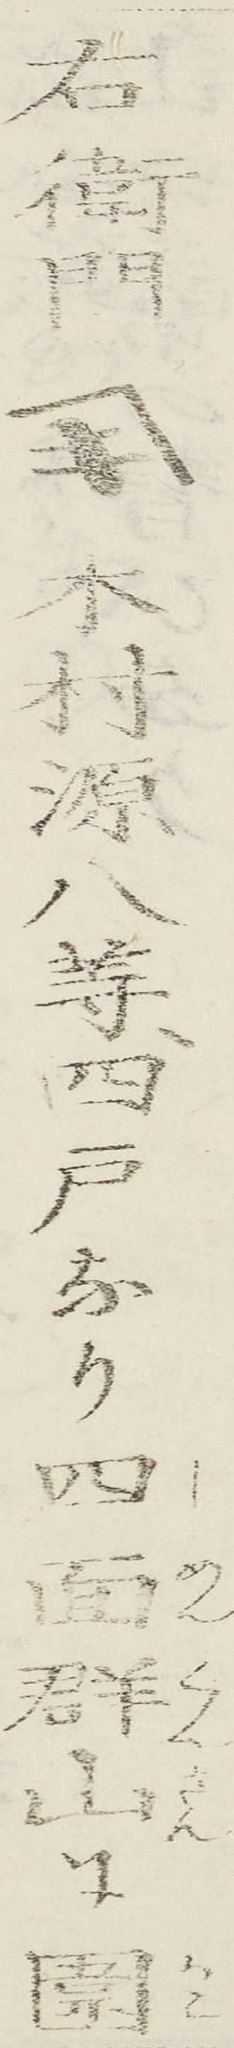右衛門木村源八等、四戸なり四面群山に囲
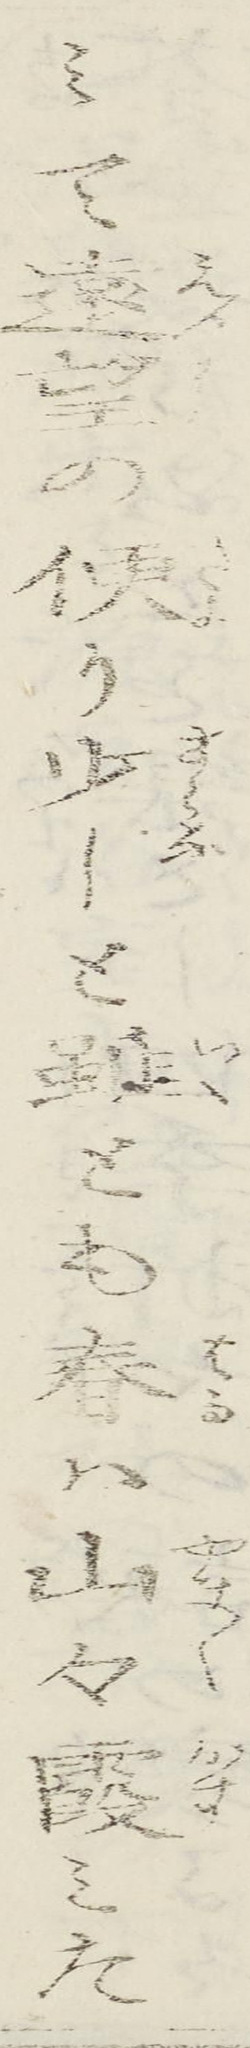みて遠望の便り少しと雖とも春は山々霞みた
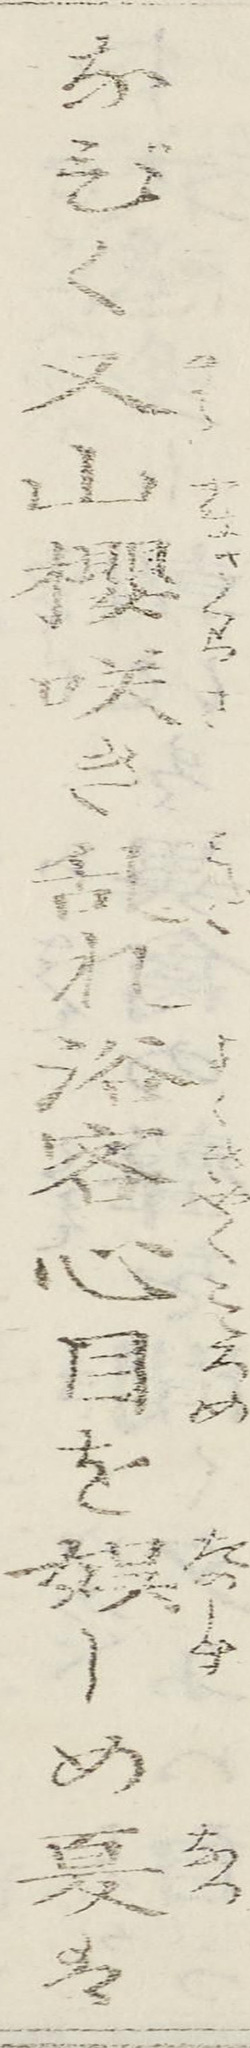なひく又山桜咲き乱れ浴客心目を娯しめ夏は
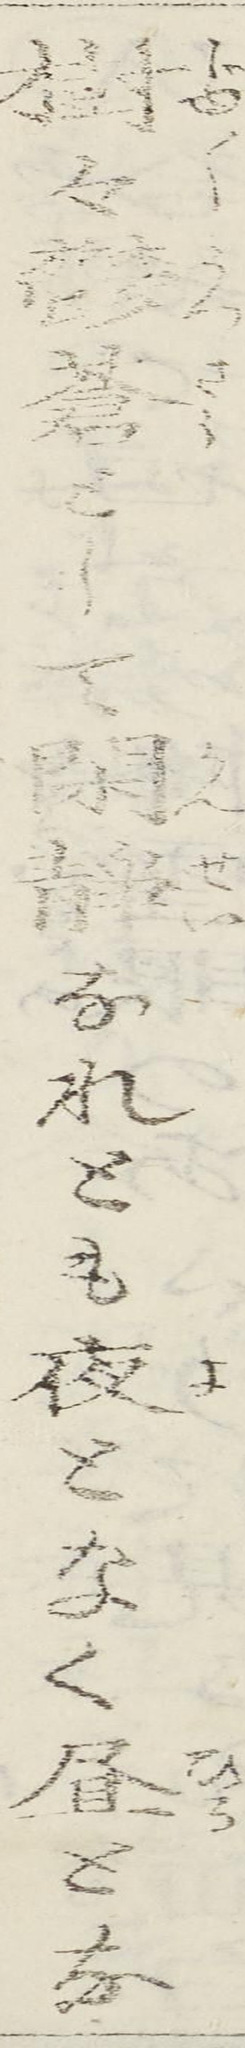樹々鬱蒼として閑静なれとも夜となく昼とな
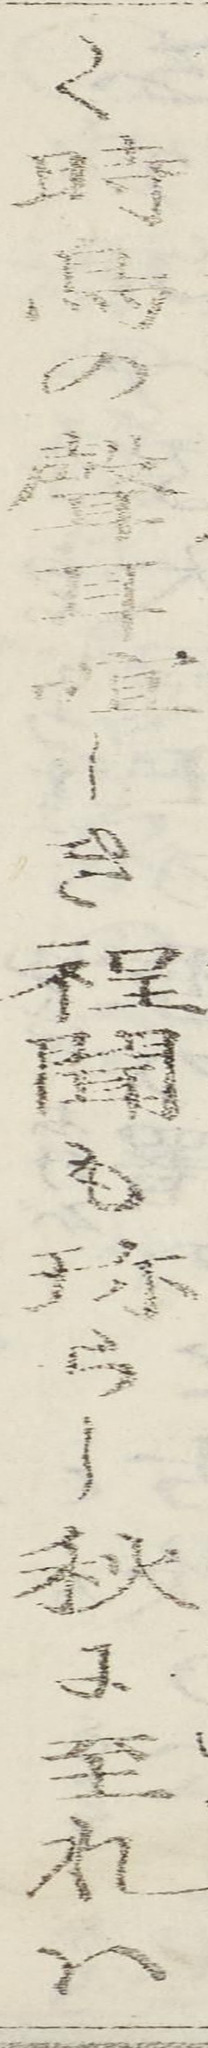く時鳥の声耳喧しき程聞も珍らし秋に至れは

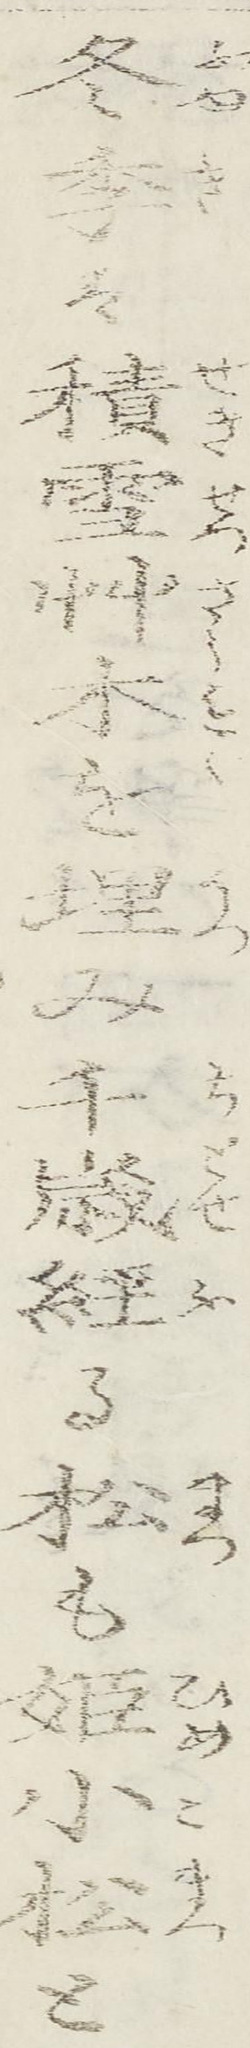冬季は積雪草木を埋み千歳経る松も姫小松と
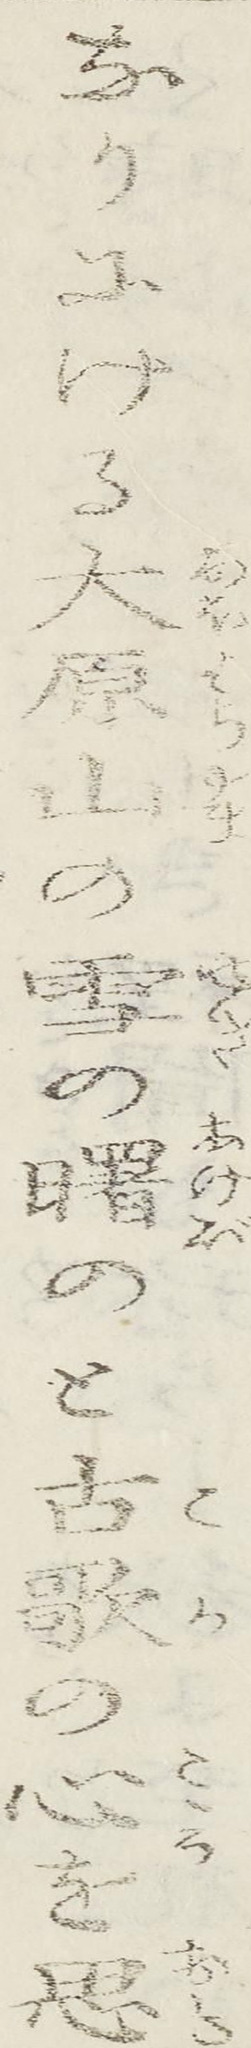なりにける大原山の雪の曙のと古歌の心を思
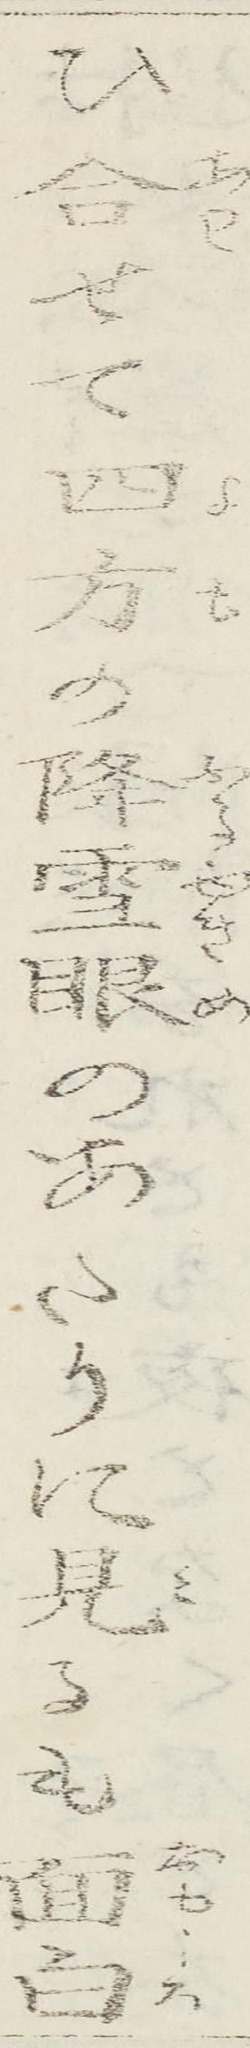ひ合せて四方の降雪眼のあたりに見るも面白
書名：鎌先温泉由來記
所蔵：東京大学地震研究所図書室 Earthquake Research Institute Library, The University of Tokyo, JAPAN
